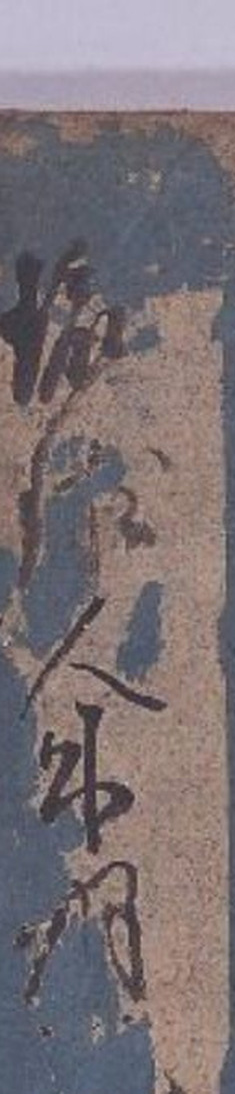琉球人来朝

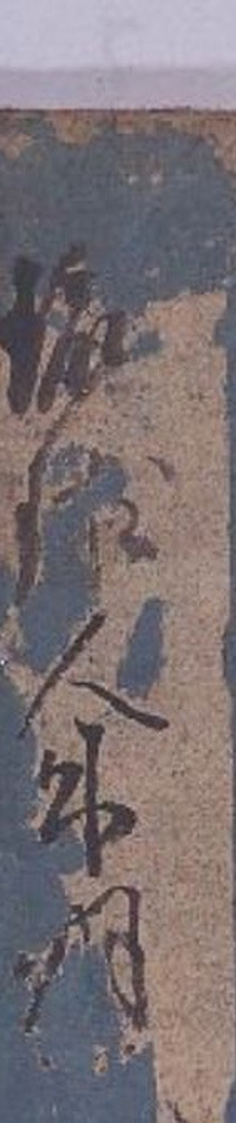琉球人来朝

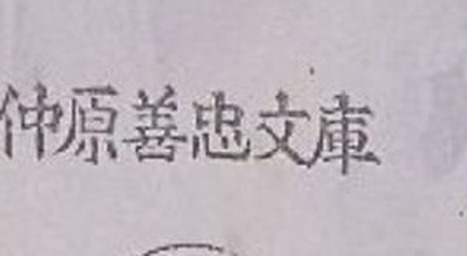中原善忠文庫印
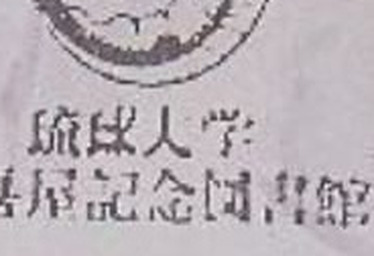琉球人学
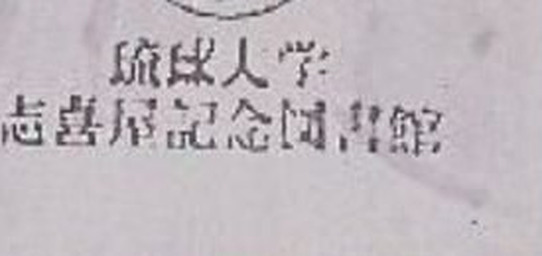志喜屋記念図書館
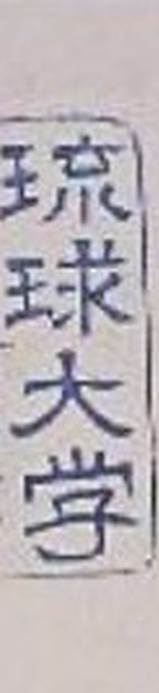琉球大学
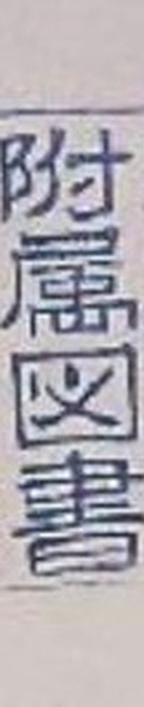附属図書
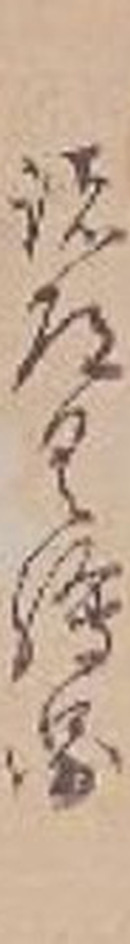諸道具絵図
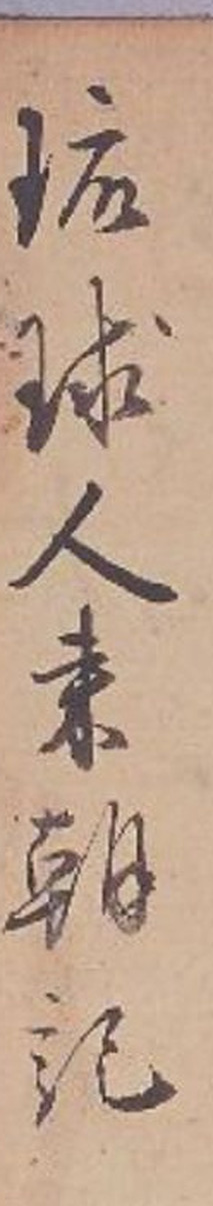琉球人来朝記

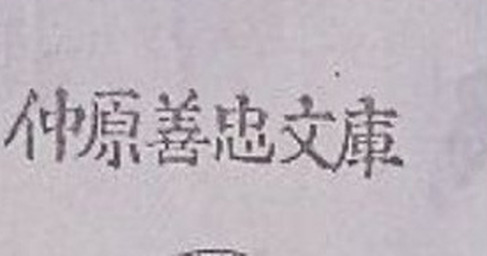中原善忠文庫印
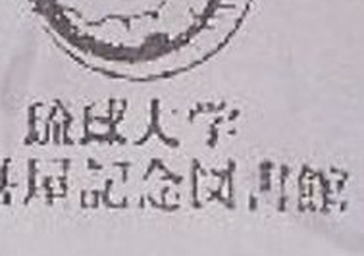琉球大学
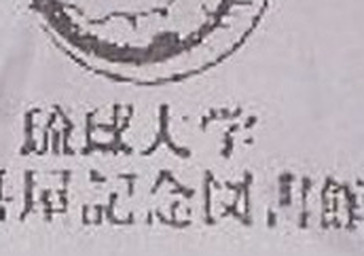琉球大学
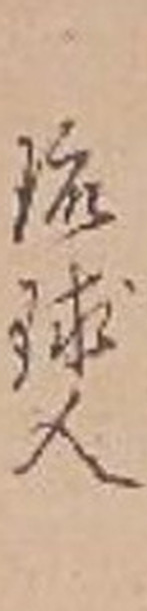琉球人
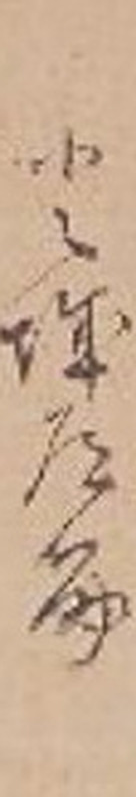登城道筋
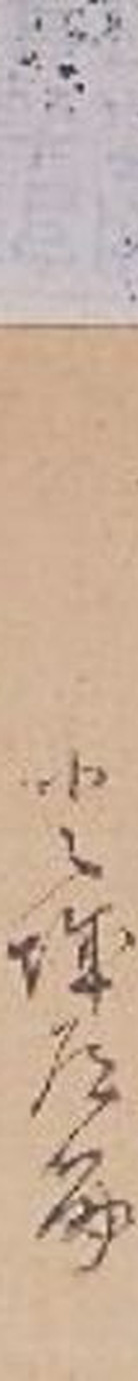登城道筋
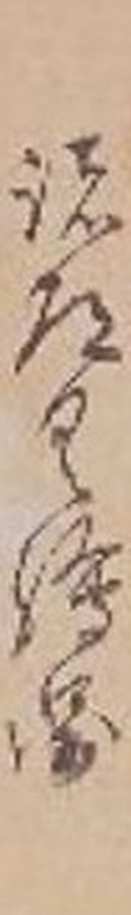諸道具絵図
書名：琉球人来朝記 三、四
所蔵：University of the Ryukyus Library
